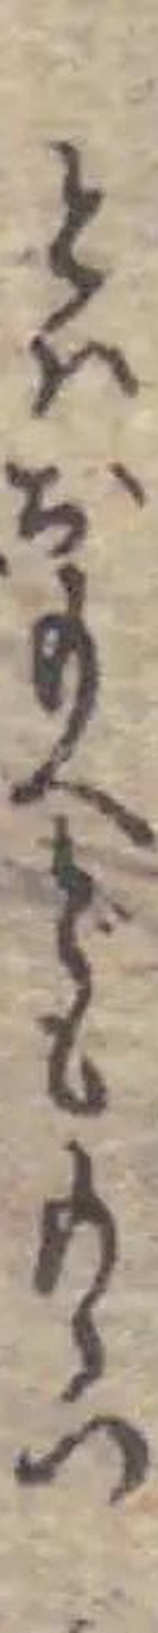とはおもへどももらつ
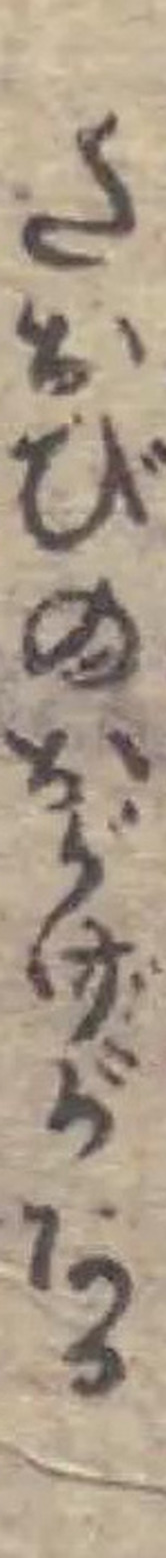たおびのおかげがなる
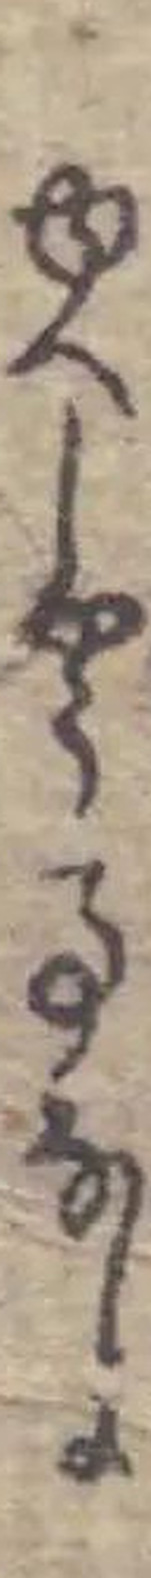ゆへしやう事なしに
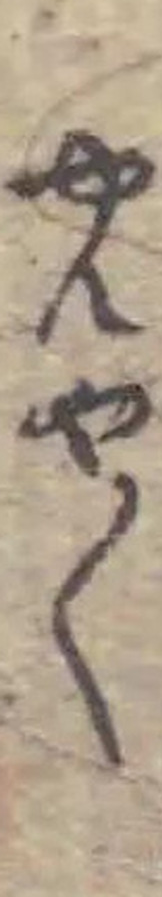やんや〳〵
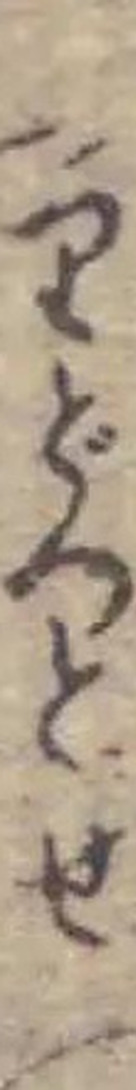りどつとせ
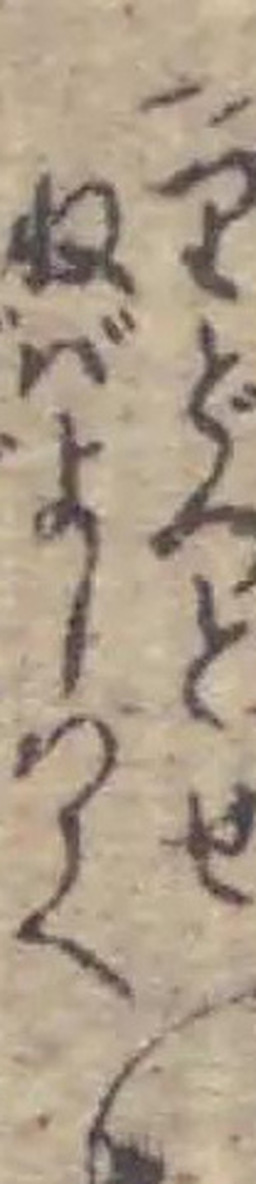ねばよしはらへ
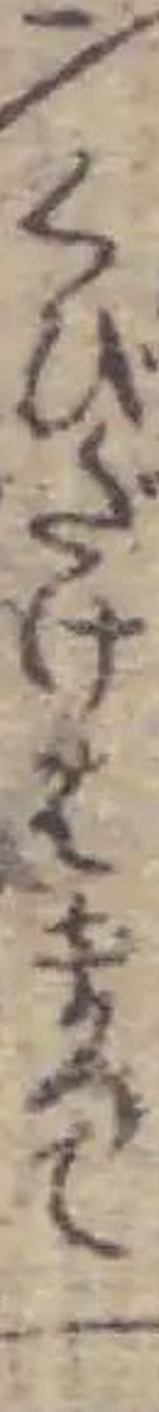くびだけはまつて
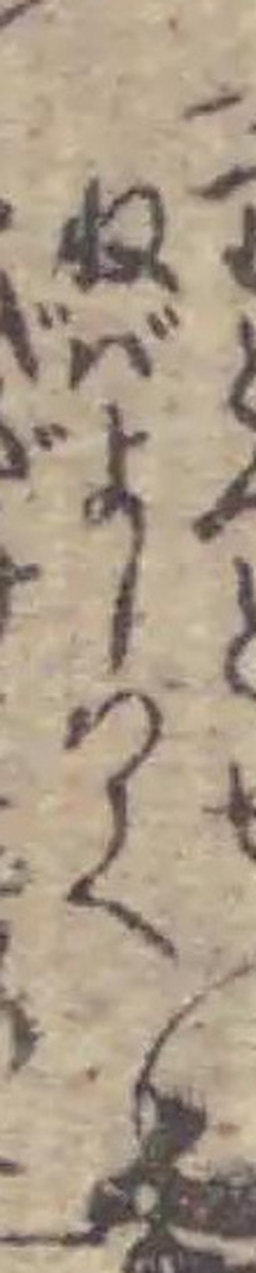ねばよしはらへ
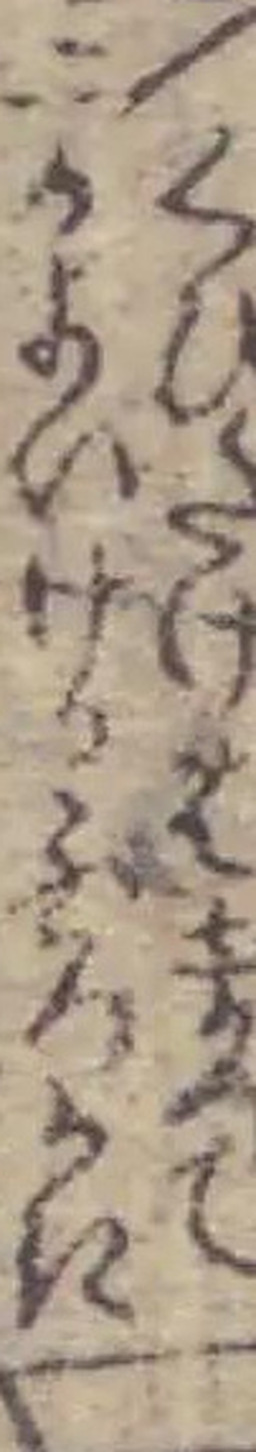かよいけるふろかき
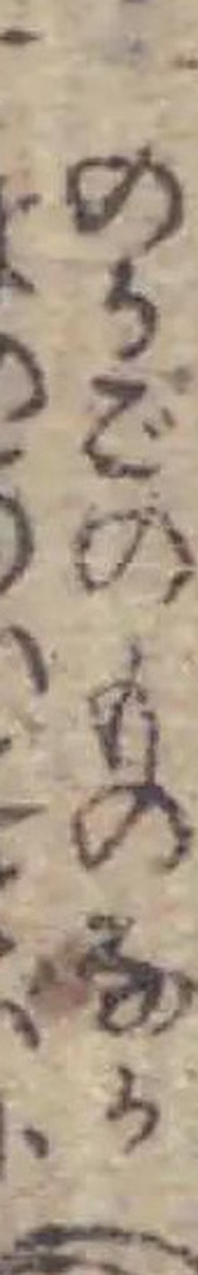のかごのものなか
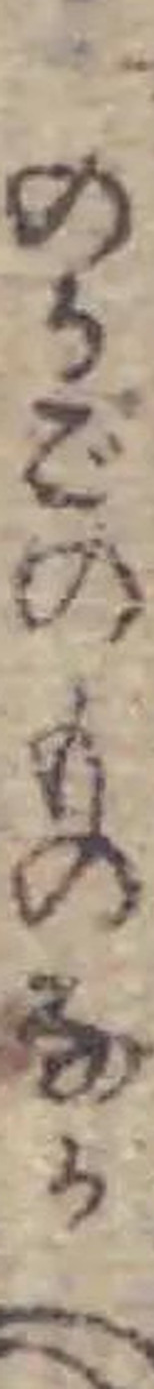のかごのものなか
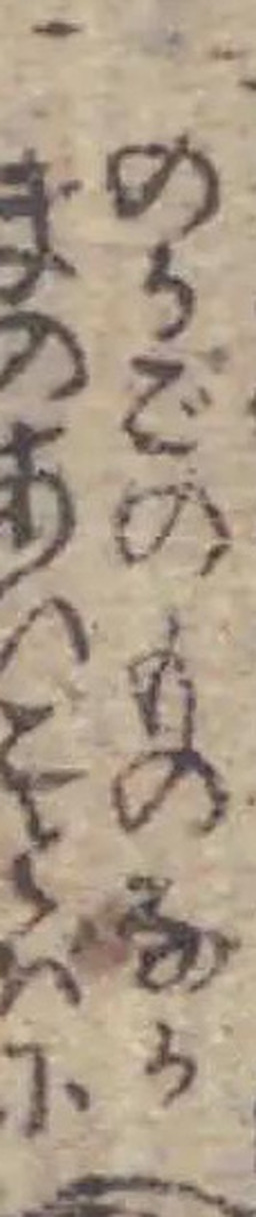まのあいことはに
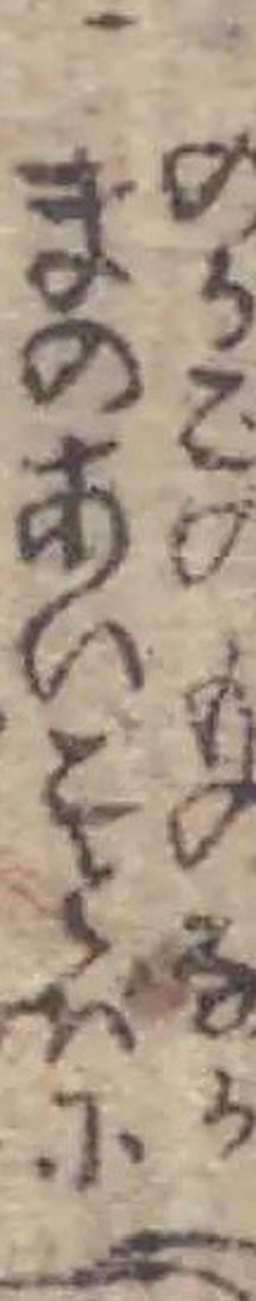まのあいことはに
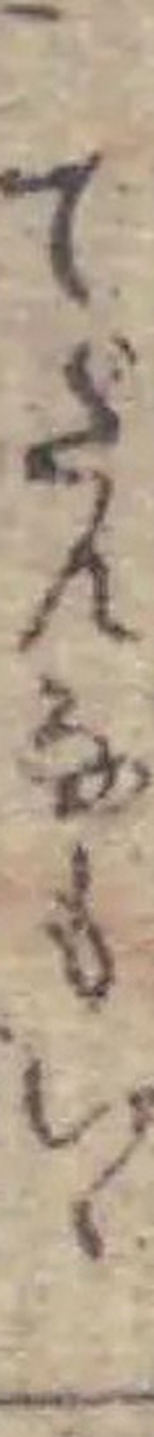てだんなもいゝ
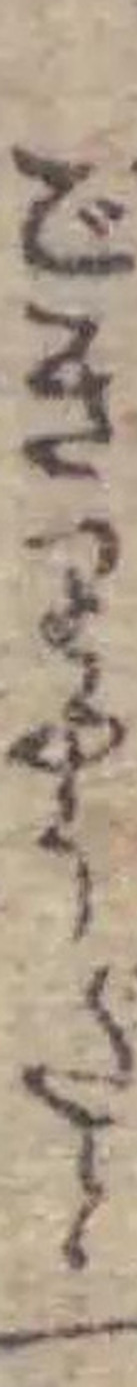ごきりやうだと
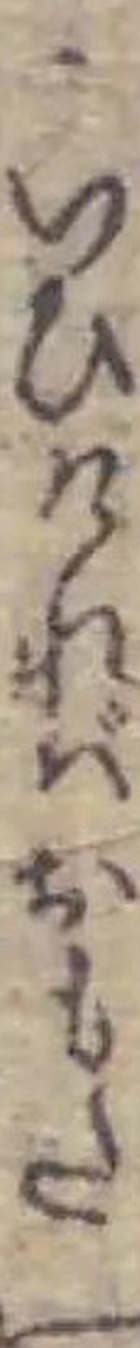いひければおもた
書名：色男其処此処 3巻
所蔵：国立国会図書館 National Diet Library, JAPAN
